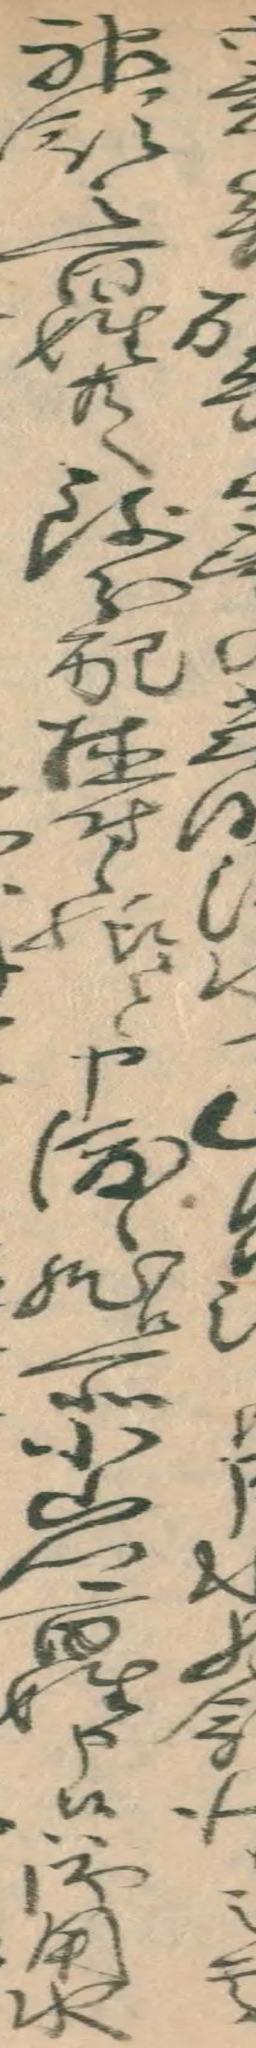神領之百姓共へ致分配植付候様ニと申渡候然ル所小山郷百姓申候ハ御用水
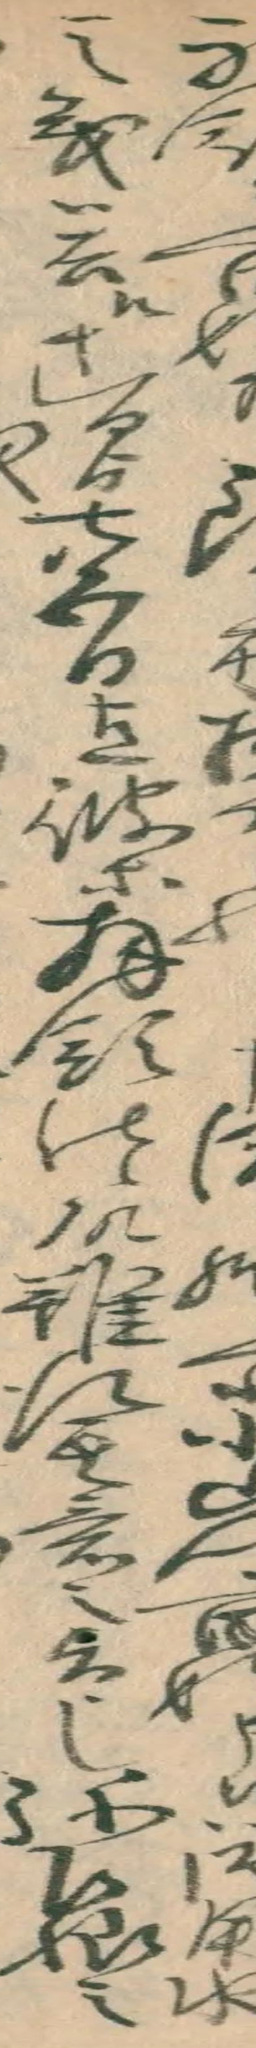之義ハ去ル十八日ゟ廿五日迄彼等拝領仕候故難得其意之旨申候弥左様之
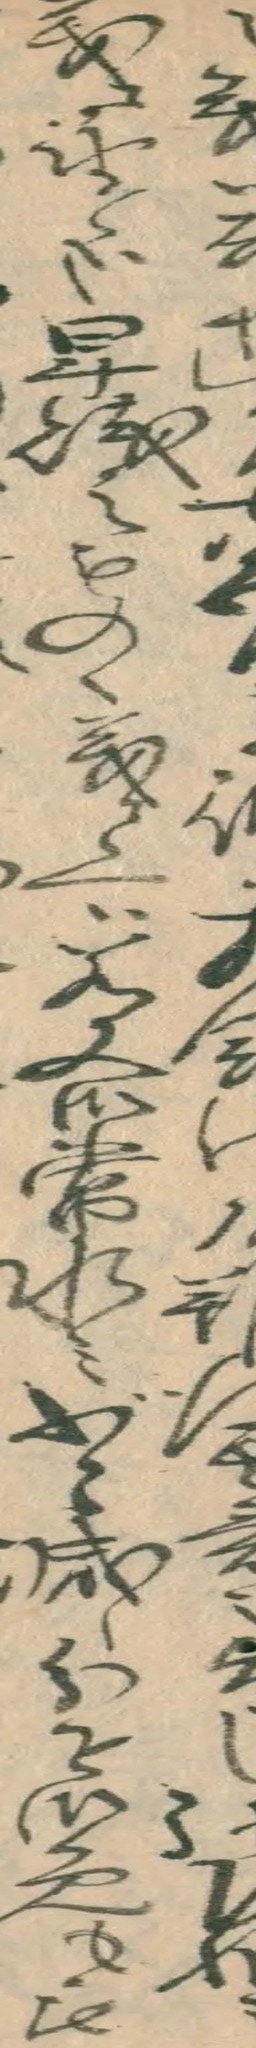義ニ御座候哉卑賎之ものゝ義ニ候へハ若又御常水之少々減し分を御免も被
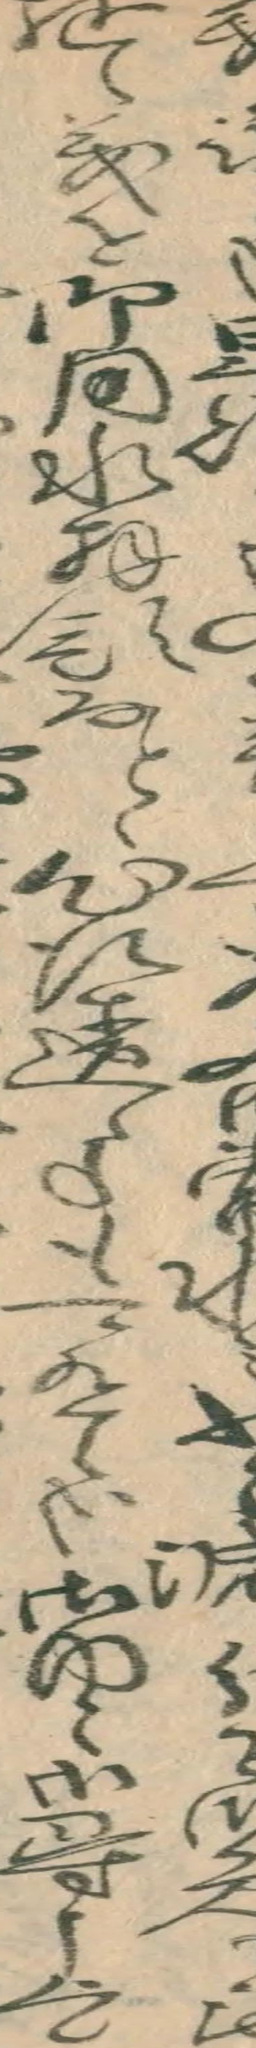遊候義を御用水拝領なとゝ心得違候事も可有之哉御内々御尋申上候
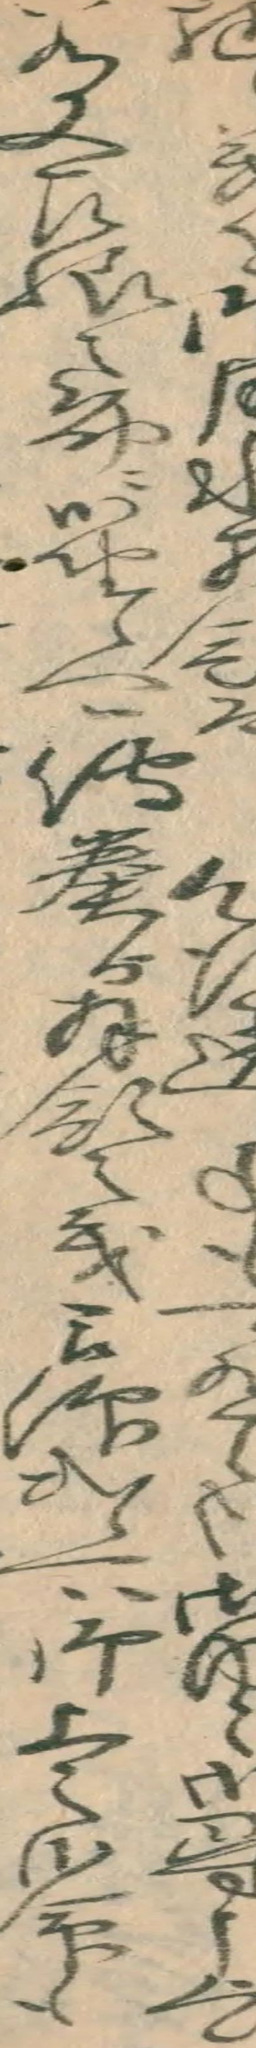若又左様之筋ニ御座候へハ伝奏ゟ拝領之義被仰出候へは御上之御命も
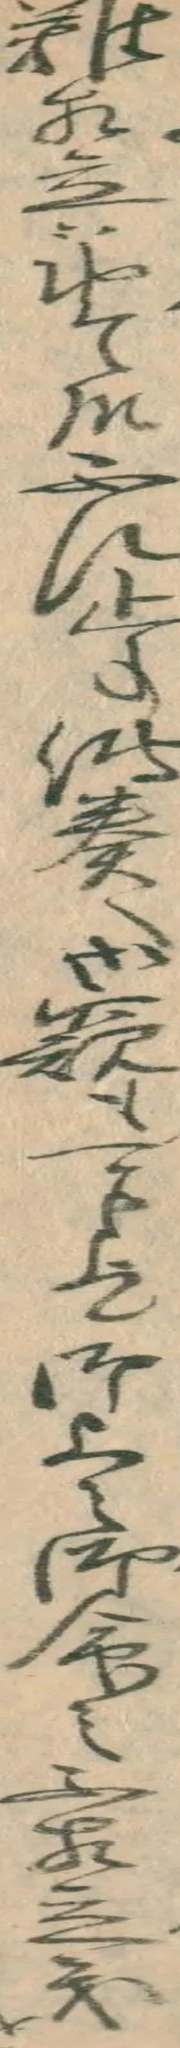難相立御座候故不得止事伝奏へ御窺も可申上候御上之御命之不相立義を
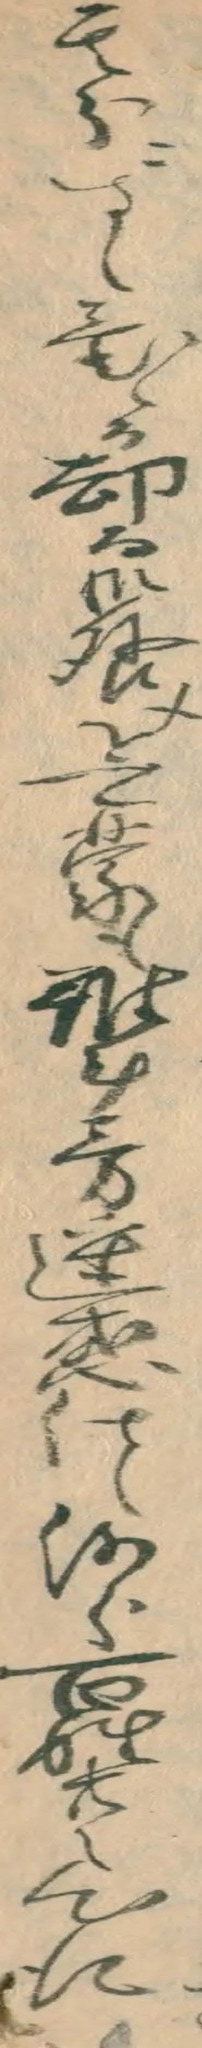其分ニいたし置候而却而御咎メを可蒙も難計旁迷惑仕候何分百姓共之心得

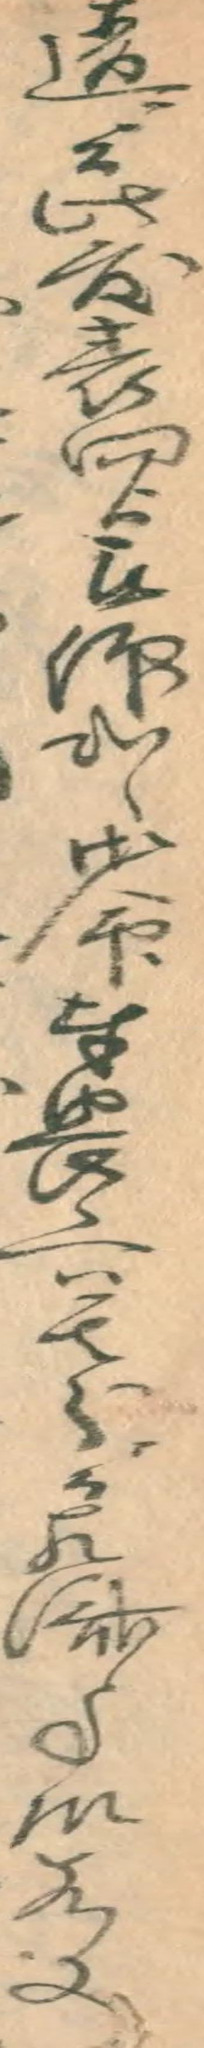違ニ候而此度表向ゟ被仰出候御命奉畏候へハ其分ニ而相済候事故若又
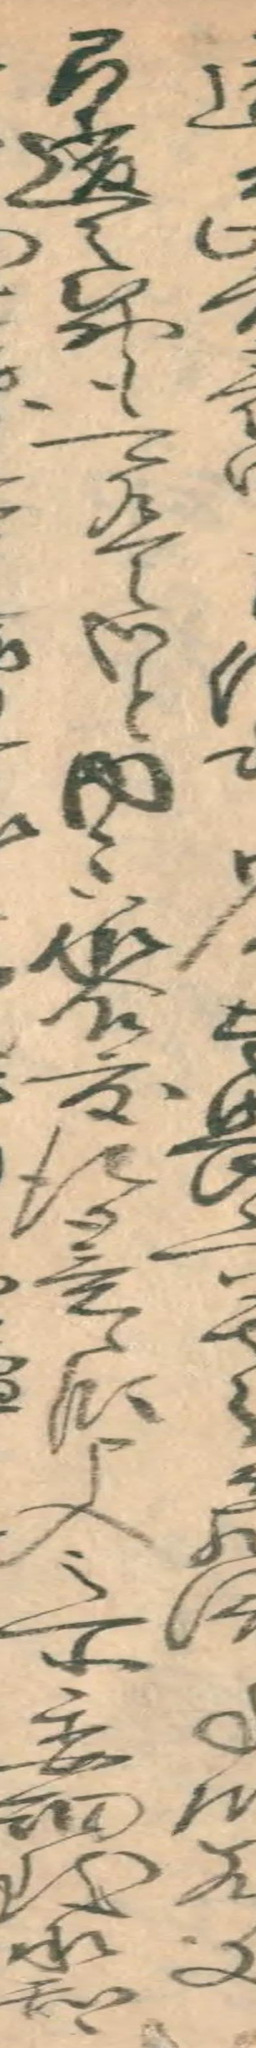間違之筋も可有之哉と内々承合度得御意候段申入之所委細致承知候
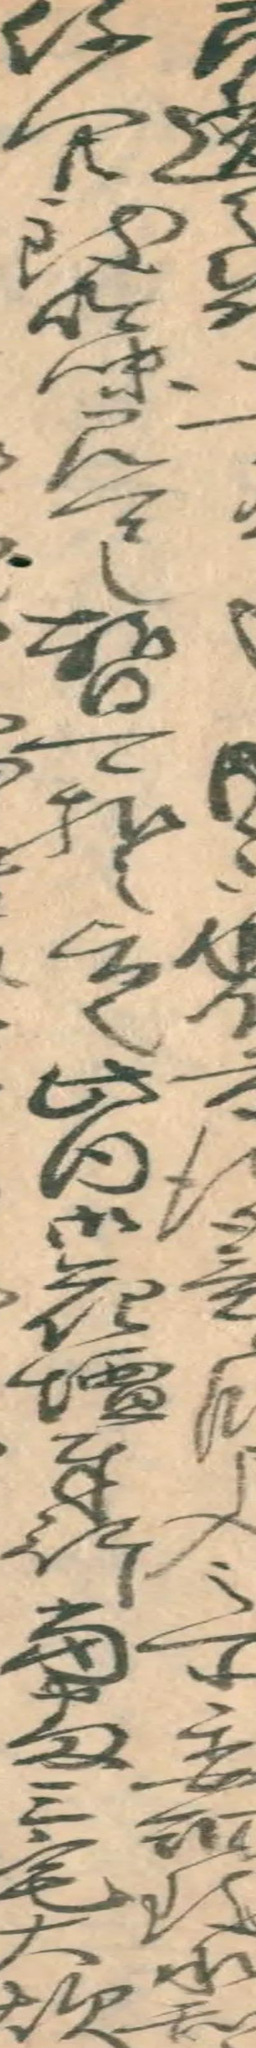役人共致吟味見可申候暫可扣之旨也此内御花壇奉行当番三宅大炊
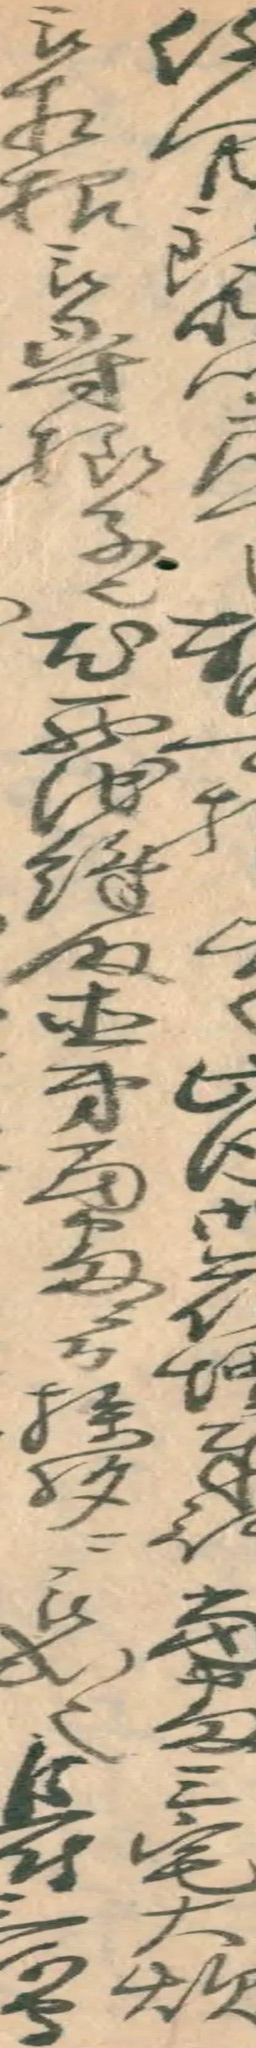被相招被尋様子也尤西池縫殿直弟当番ニ而挨拶ニ被出也追付三河守
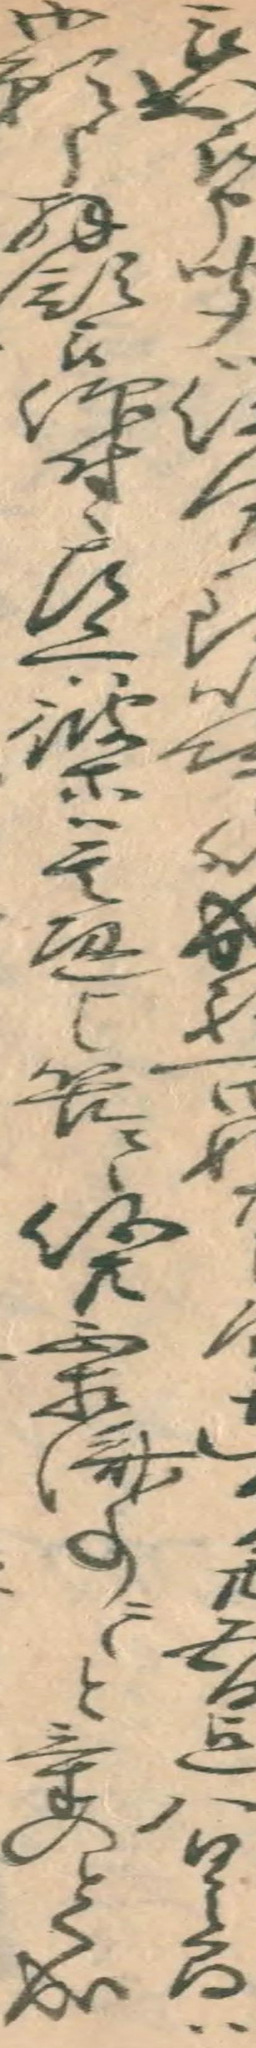御願申拝領被仰付候左候ヘハ彼等ハ其通申候筈ニ候何共不相済事ニ候と気のとく成
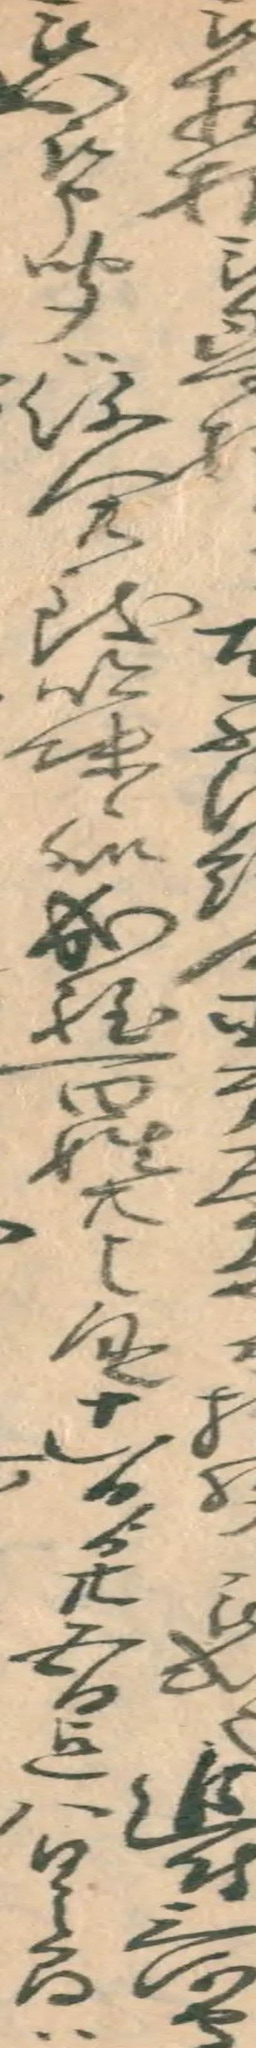被出被申聞ハ役人共致吟味候処成程百姓共申候通十八日ゟ廿五日迄八日之間ハ
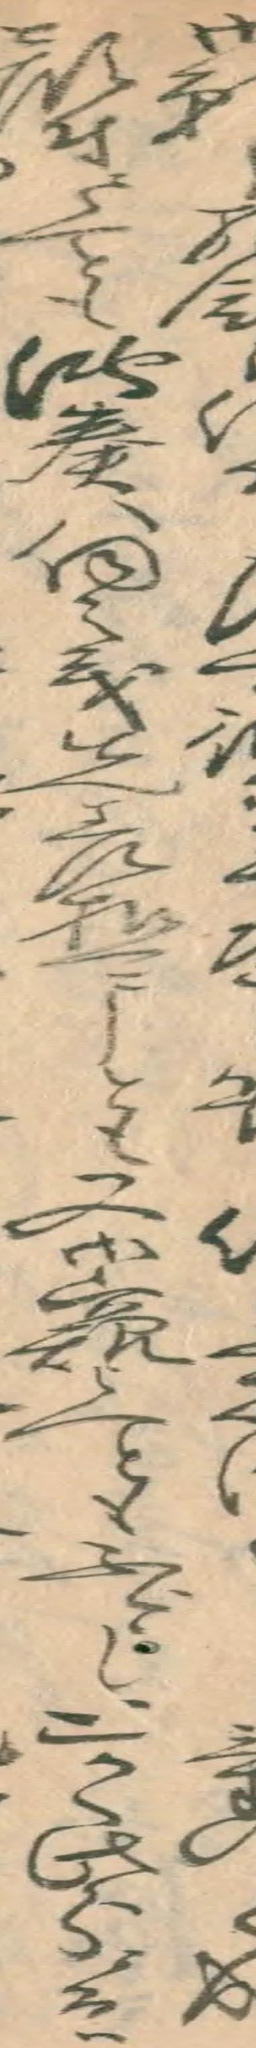顔付ニ候へとも伝奏へ伺之義先差扣可申候とも又御窺候へとも不被申候とかく此分ニ而ハ
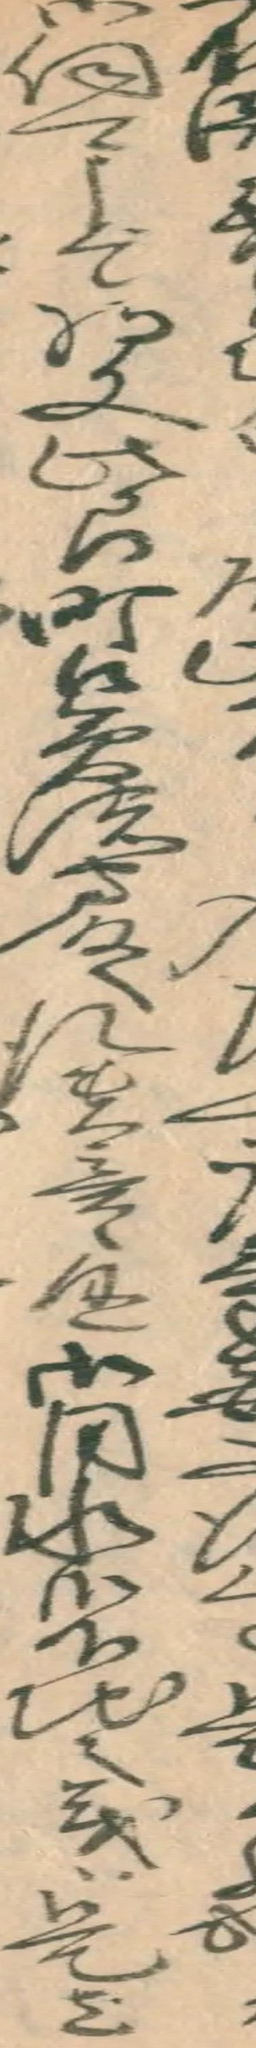御伺可申上候将又此間町口美濃守殿へ得貴意候通御用水御下地之義ハ是迄
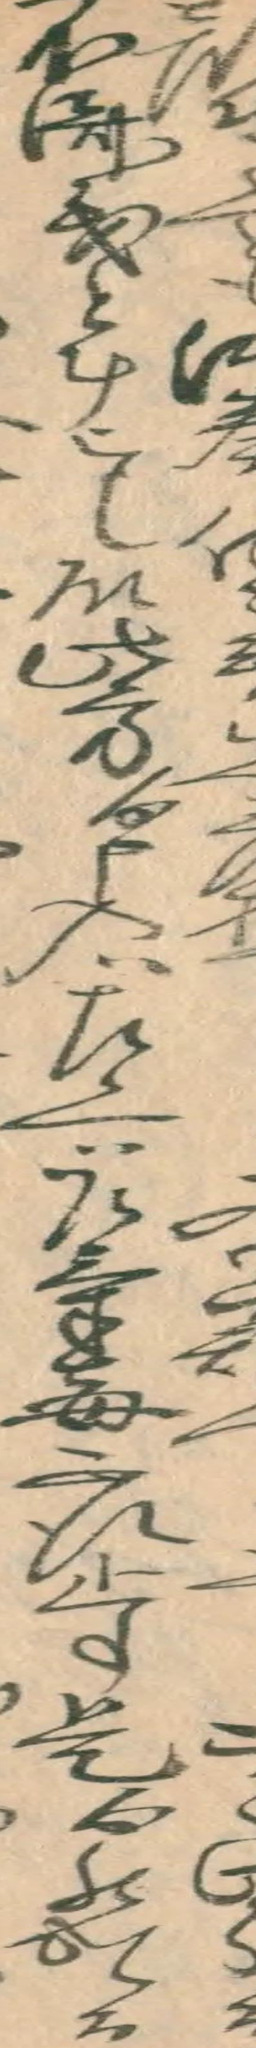不済義と計被申候故此方ゟ申入ハ左候へハ乍気毒不得止事是ゟ罷出候而
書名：賀茂社記録. 第58冊
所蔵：国立国会図書館 National Diet Library, JAPAN
